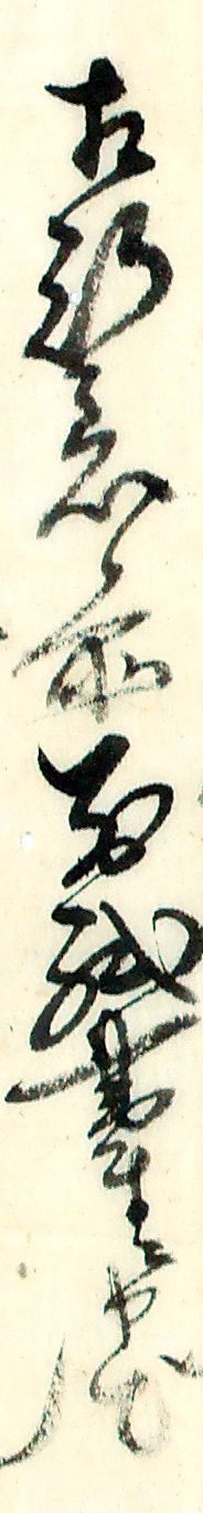相行着候所別紙書付に申出
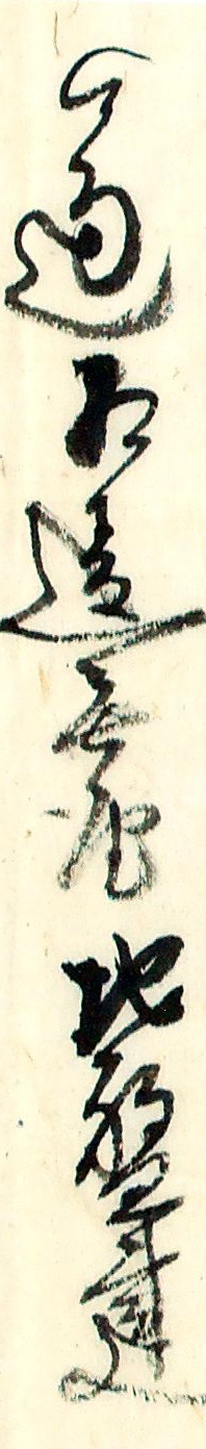候通相違無御座地盤建
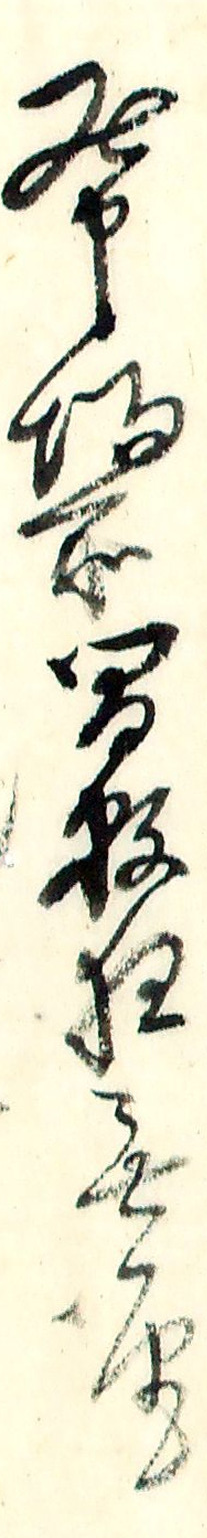居中場所間数狂無御座
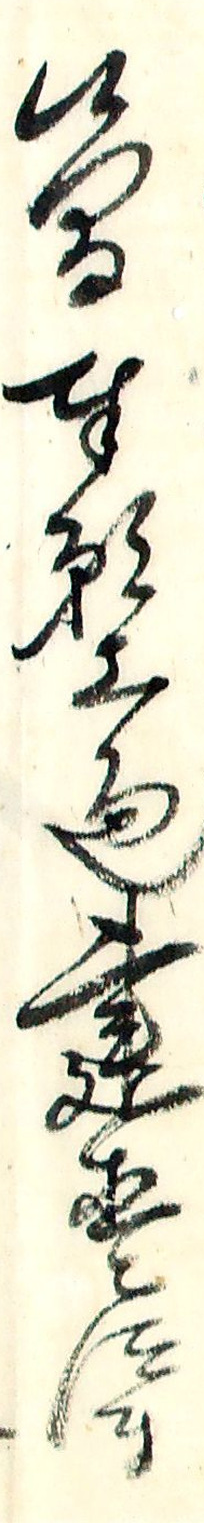候間奉願上通建直被仰付

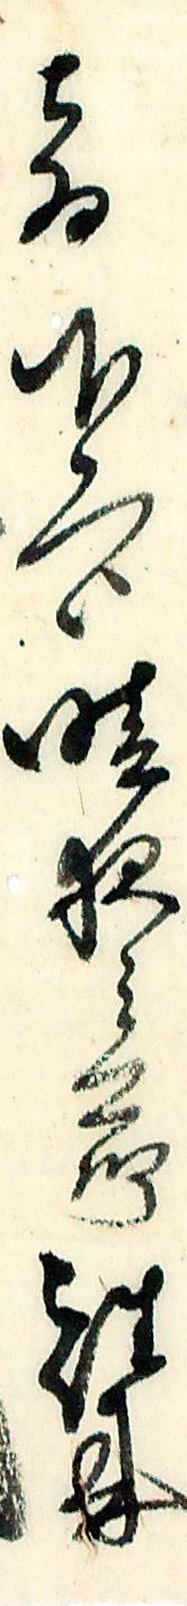被為下候へは暗夜之節往来
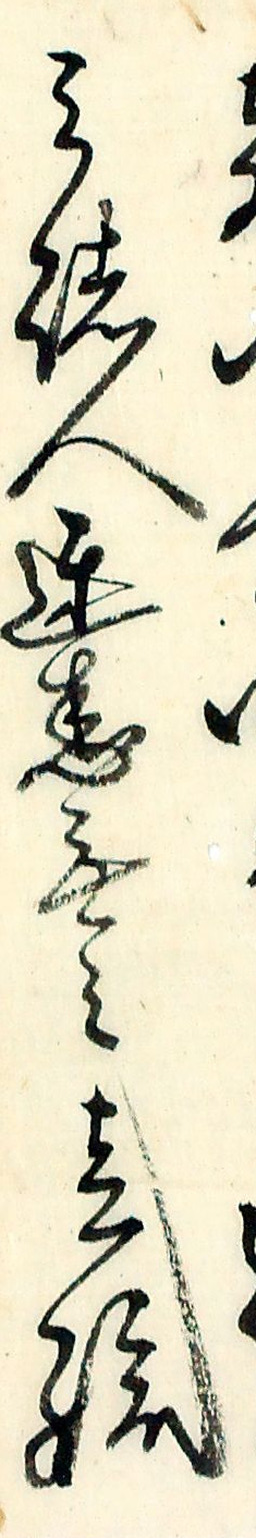之諸人迷惑無之壱統
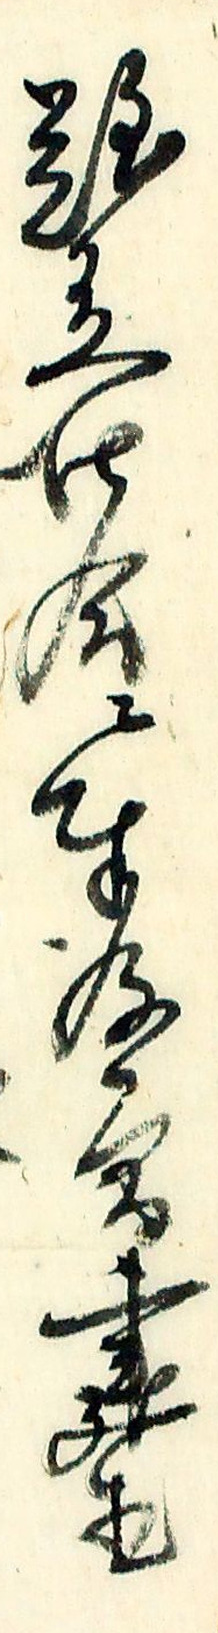難有仕合に奉存候間建直
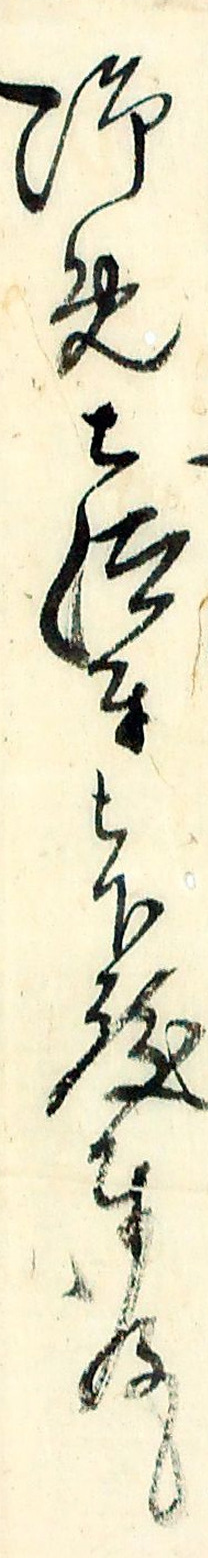御免被仰付被下度奉存候
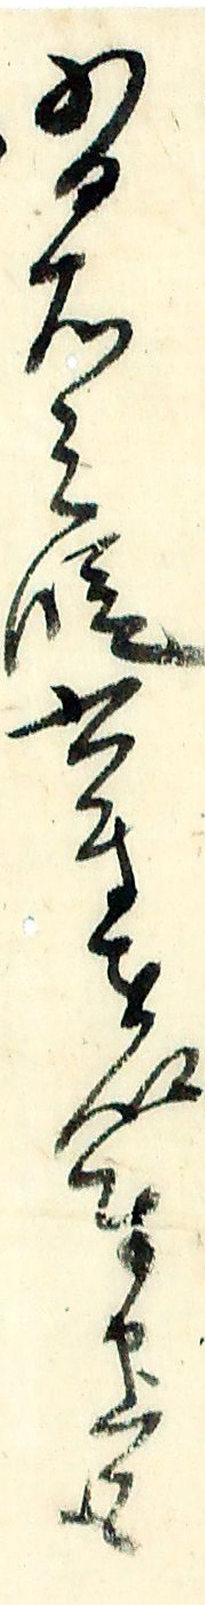仍て右之段書付を以奉申上候以上
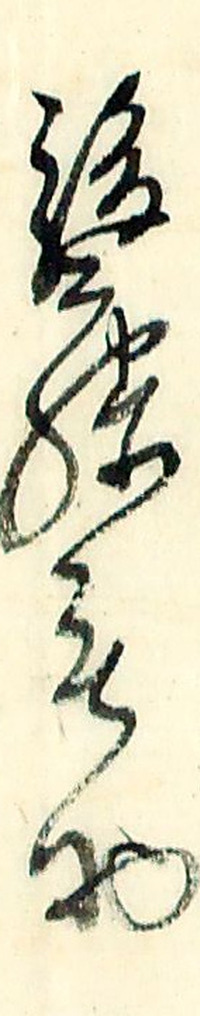後藤庄助
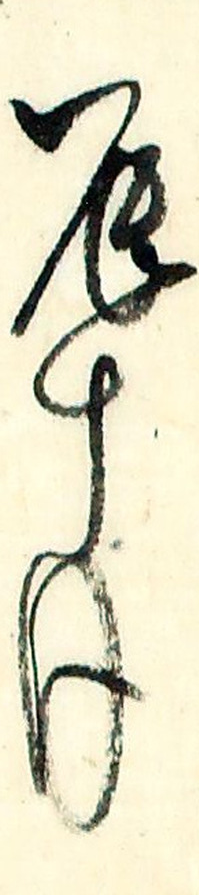辰十月
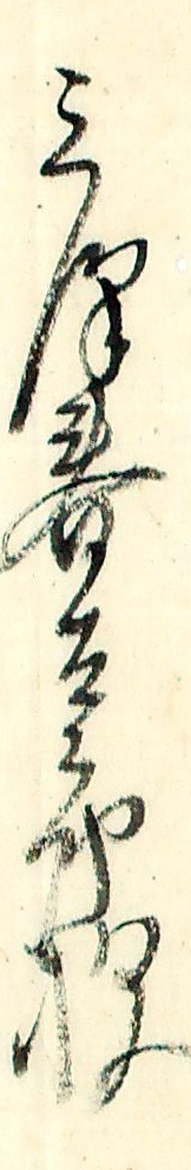三沢春太郎様
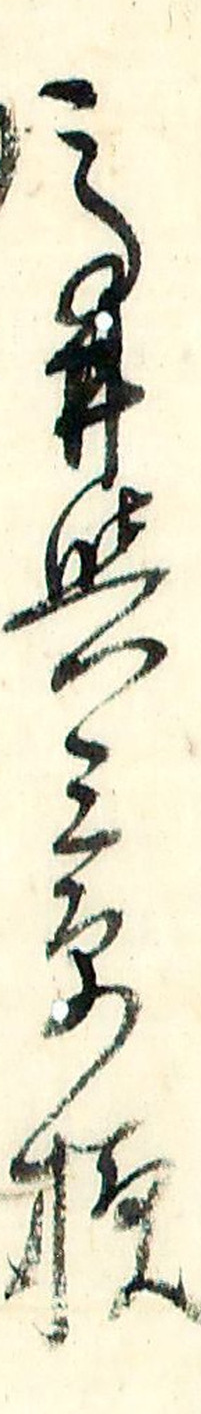高井与三兵衛様
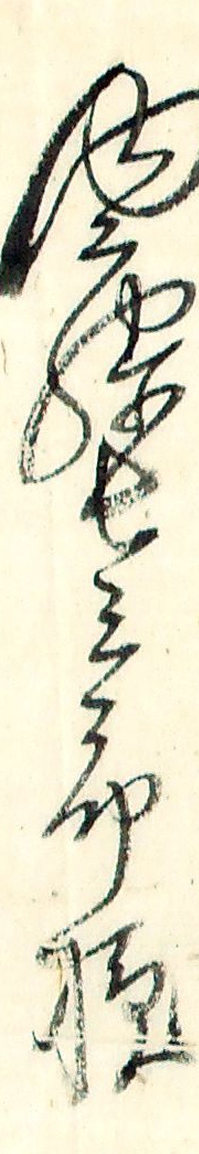内藤七三郎様

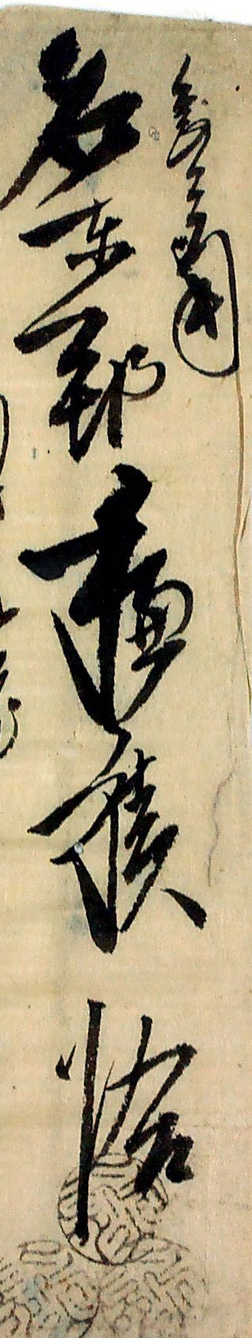名東郡穂積恰

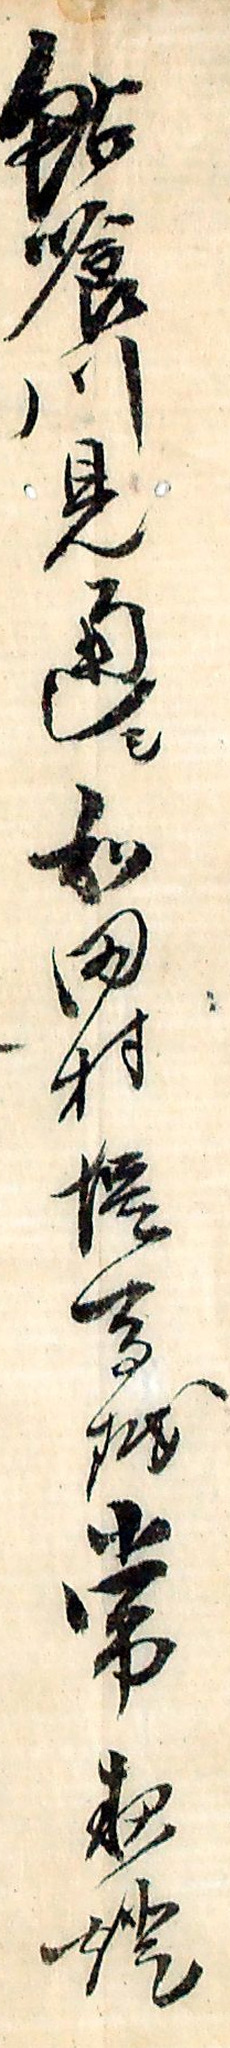鮎喰川見通し和田村堤馬越常夜灯
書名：和田村常夜燈建直行着添書控
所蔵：鳴門教育大学 Naruto University of Education
